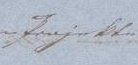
verschiedenen
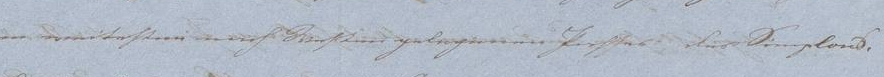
des am weitesten nach Westen gelegenen Passes, des Simplons.
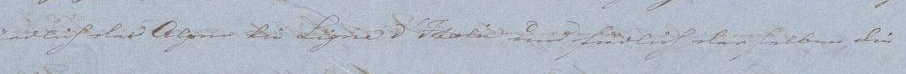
nördlich der Alpen die Ligne d'Italie und südlich derselben die
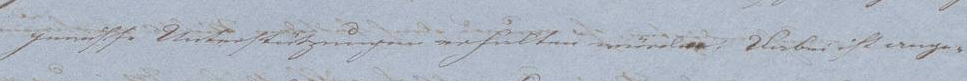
gewisse Unterstützungen erhalten würde. Dabei ist ange-
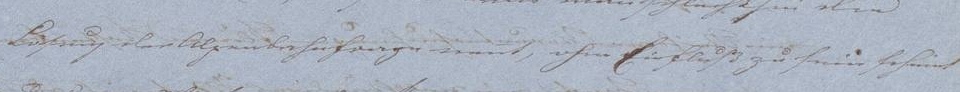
Lösung der Alpenbahnfrage nennt, ohne Einfluß zu sein scheint
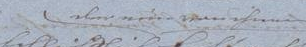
genommen und schließlich
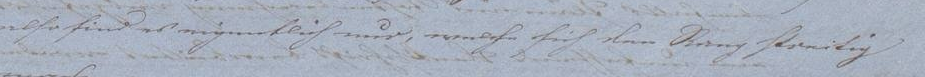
also sind es eigentlich nur, welche sich den Rang streitig
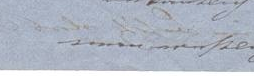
ernstlich als
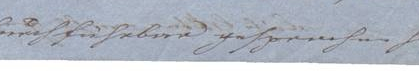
und durchführbar gesprochen hat.
